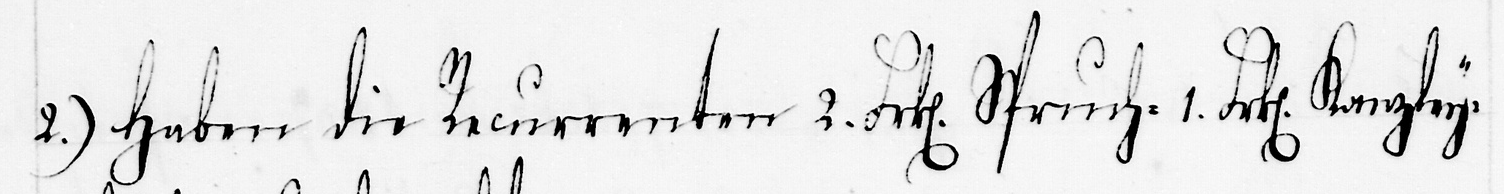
2.) Haben die Recurrenten 2. Frk[en]. Spruch-
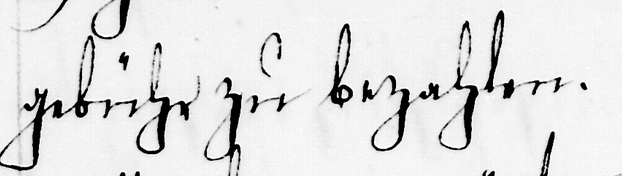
gebühr zu bezahlen.
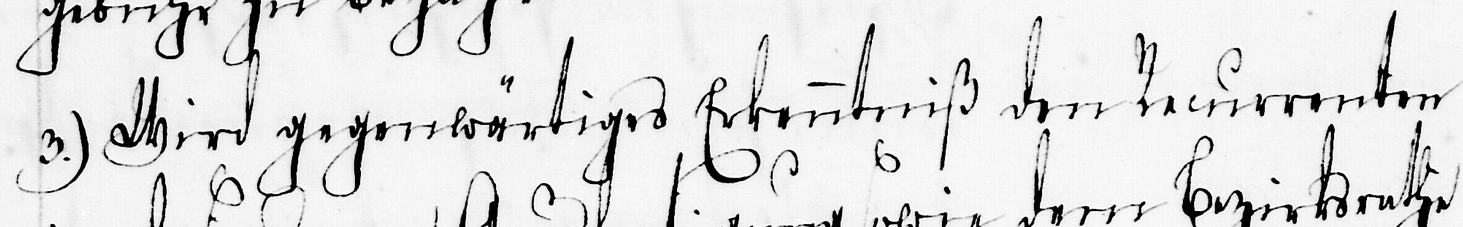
3.) Wird gegenwärtiges Erkenntniß den Recurrenten
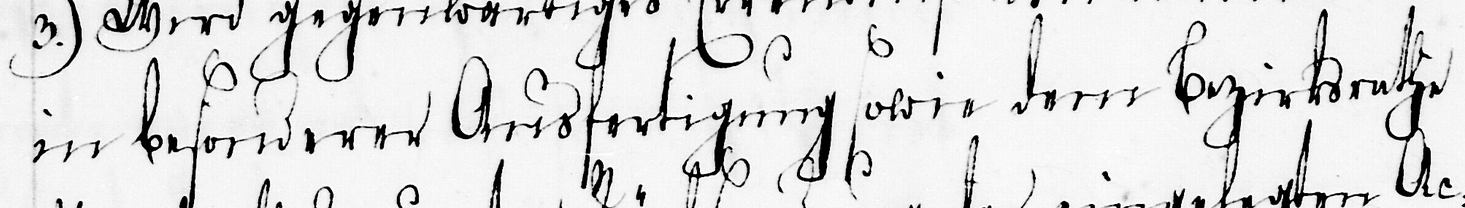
in besonderer Ausfertigung sowie dem Bezirksrathe
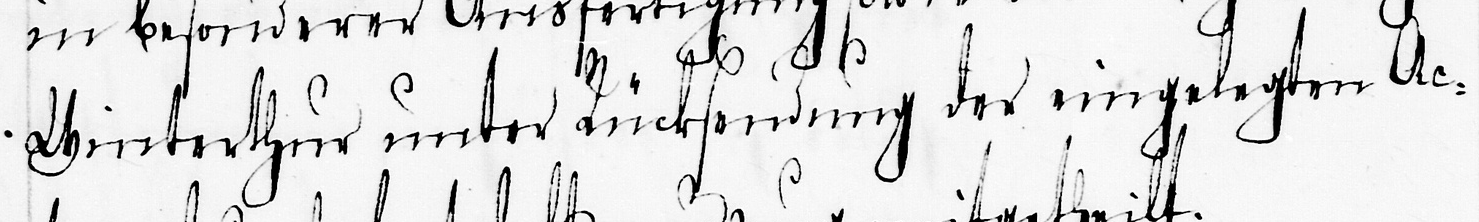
Winterthur unter Rücksendung der eingelegten Ac¬
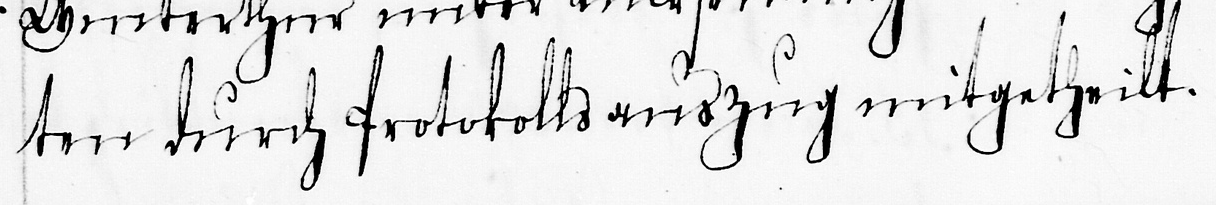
ten durch Protokollsauszug mitgetheilt.
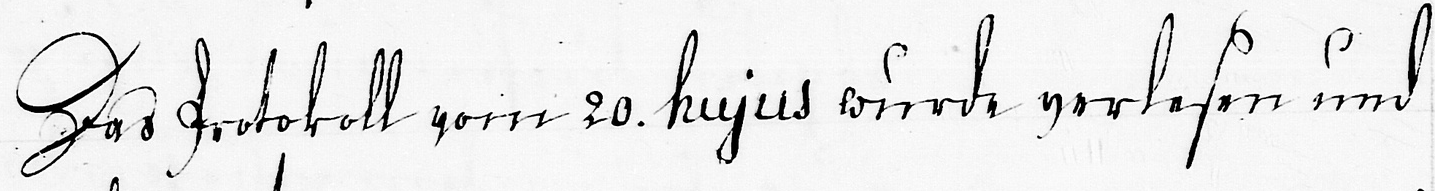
Das Protokoll vom 20. hujus wurde verlesen und
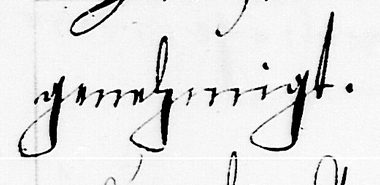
genehmigt.
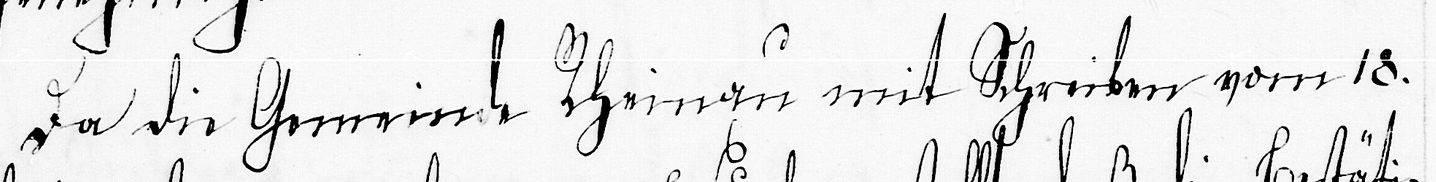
Da die Gemeinde Rheinau mit Schreiben vom 18.
